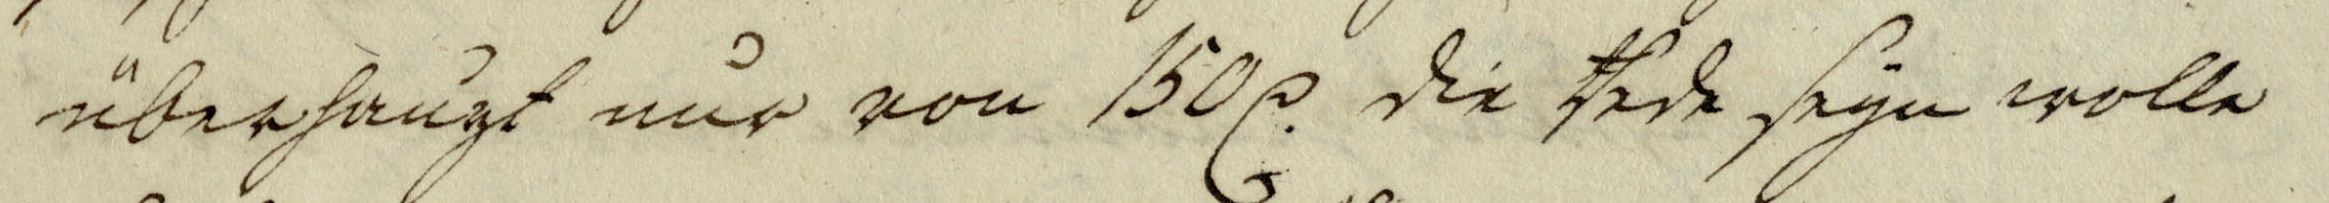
überhaupt nur von 150 rtl. die Rede seÿn wolle
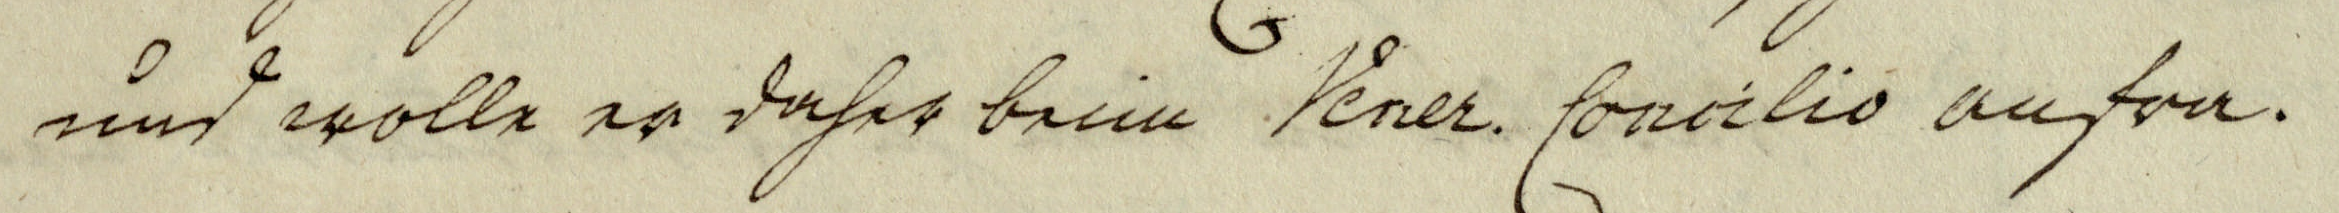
und wolle er daher beim Vener. Concilio anfra¬
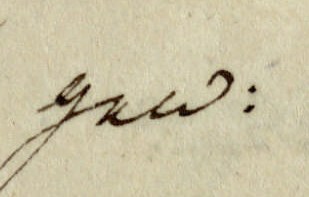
gen:
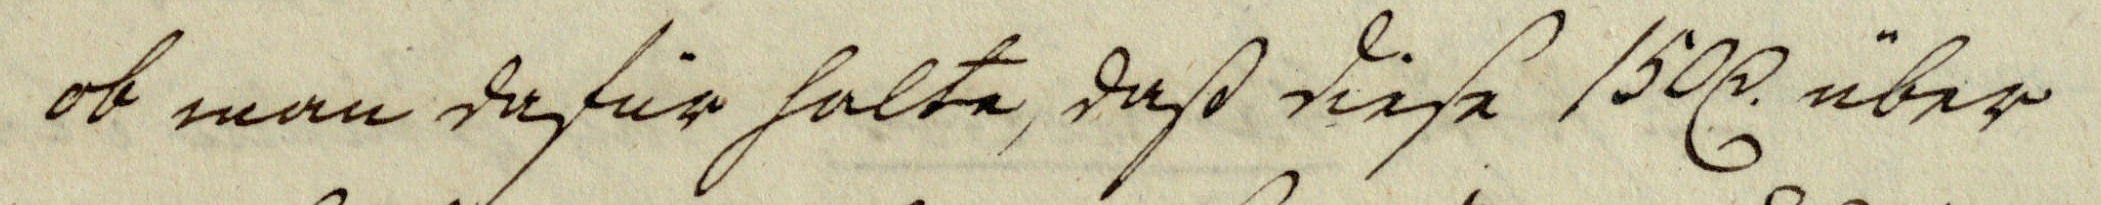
ob man dafür halte, daß diese 150 rtl. über
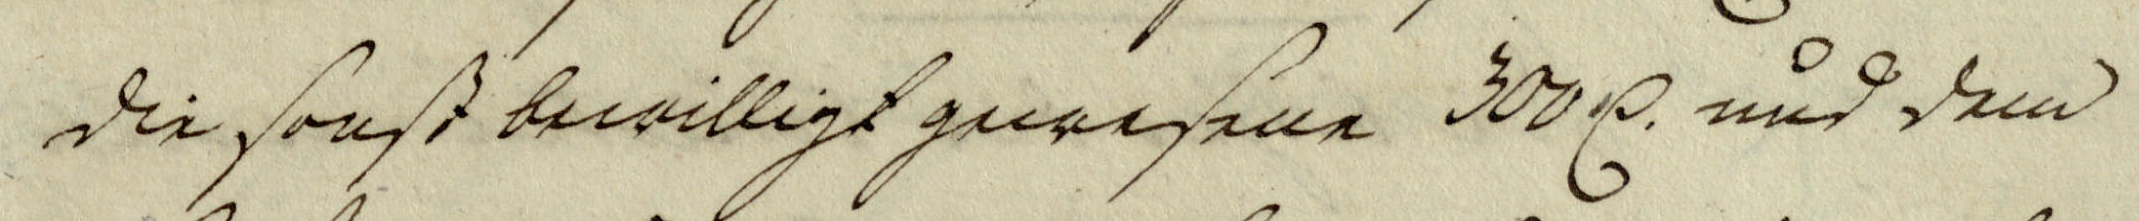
die sonst bewilligt gewesen 300 rtl. und dem
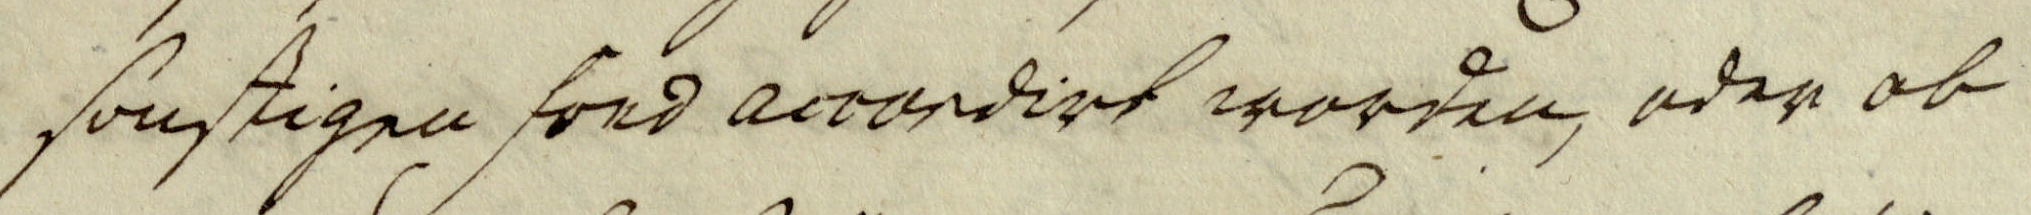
sonstigen Fond accordirt worden, oder ob
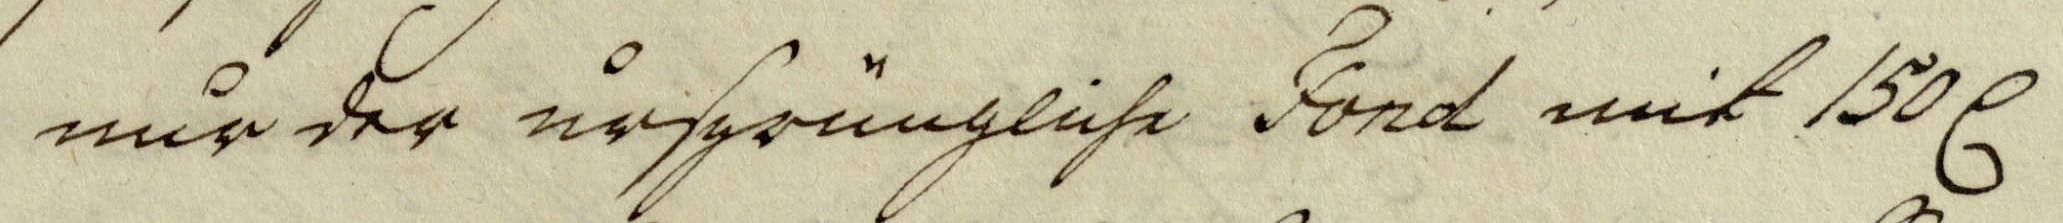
nur der ürsprüngliche Fond mit 150 rtl
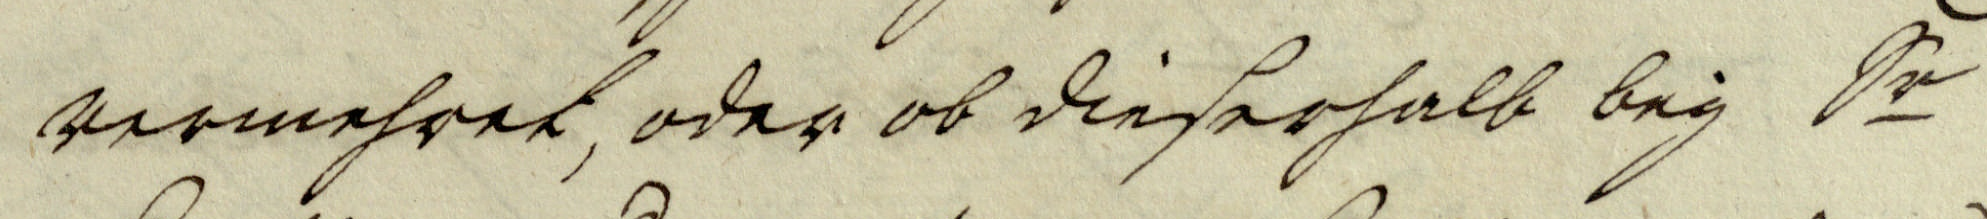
vermehret, oder ob dieserhalb beÿ Sr
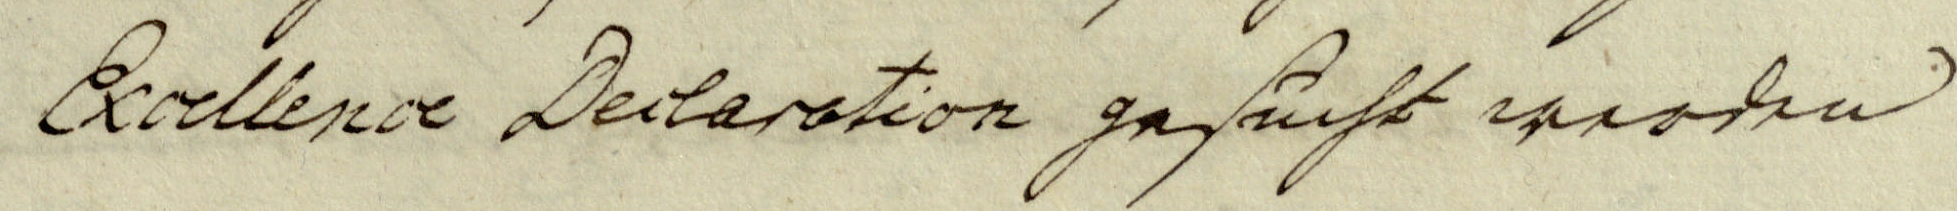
Excellence Declaration gesucht werden
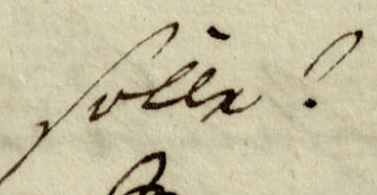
solle?
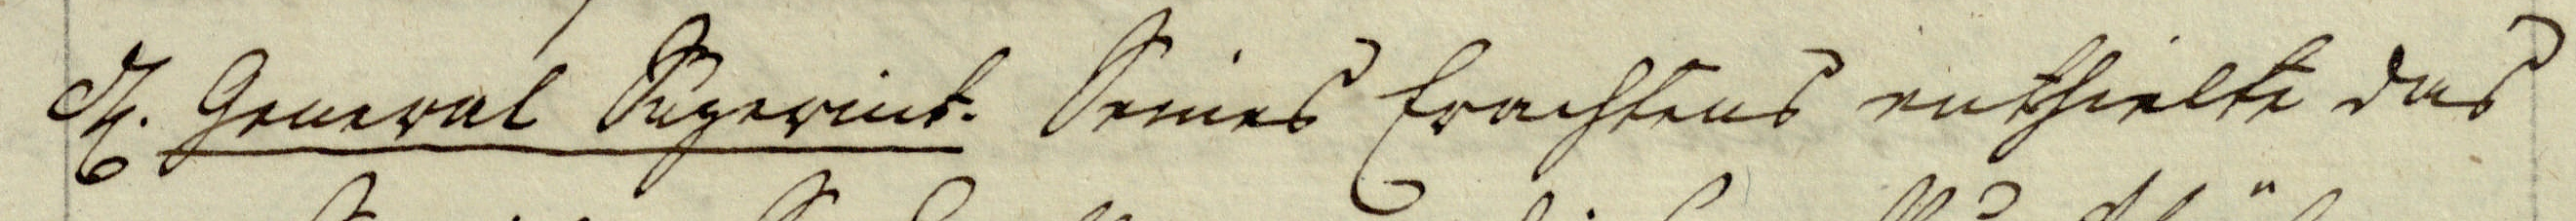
dh. General Superint. Seines Erachtens enthielte das
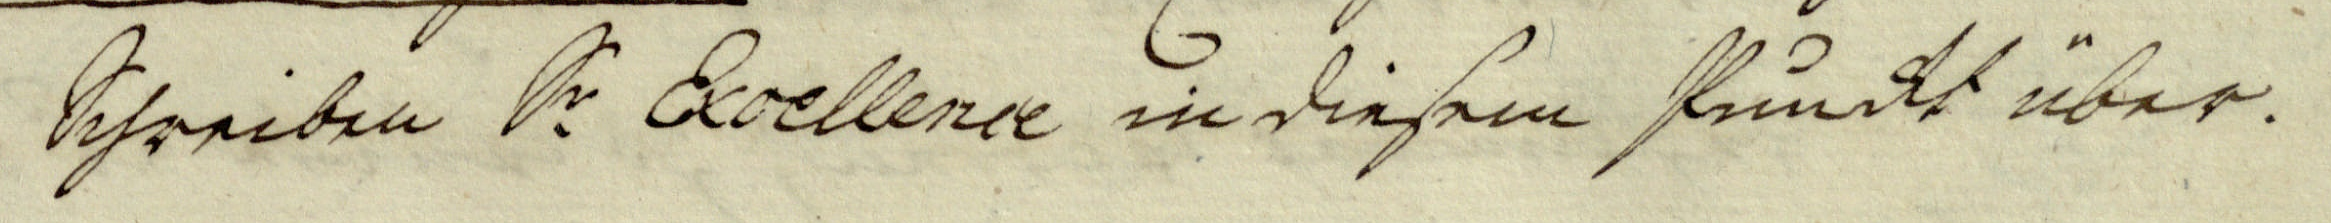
Schreiben Sr Excellence in diesem Punkt über¬
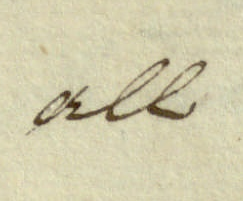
all
